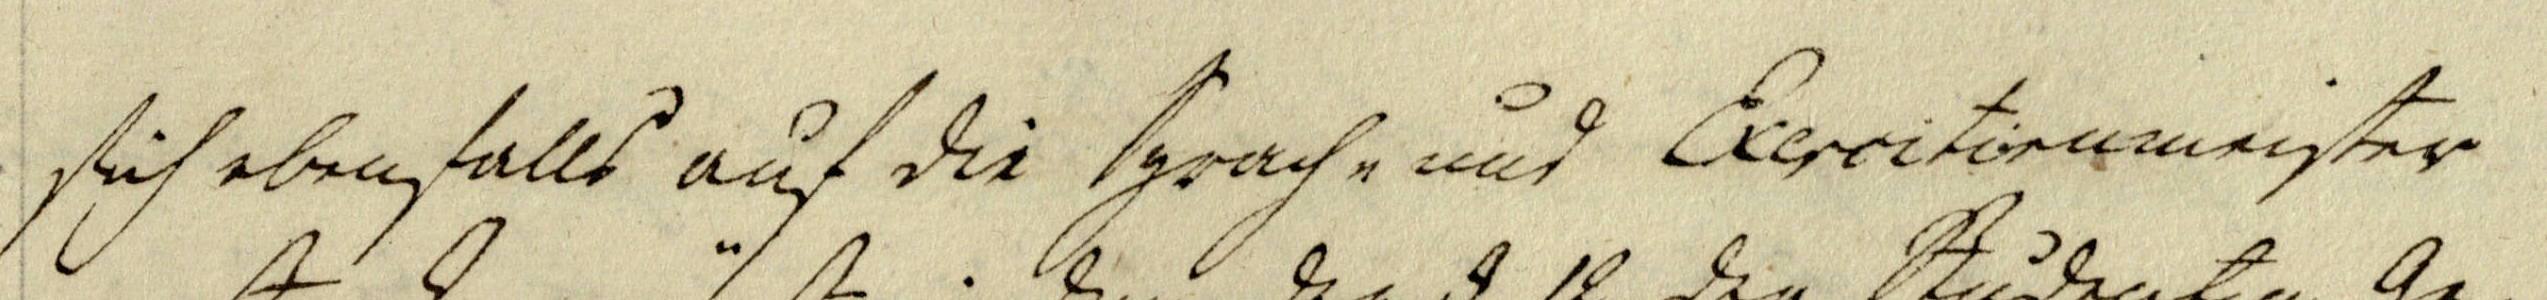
sich ebenfalls auf die Sprach- und Exercitienmeister
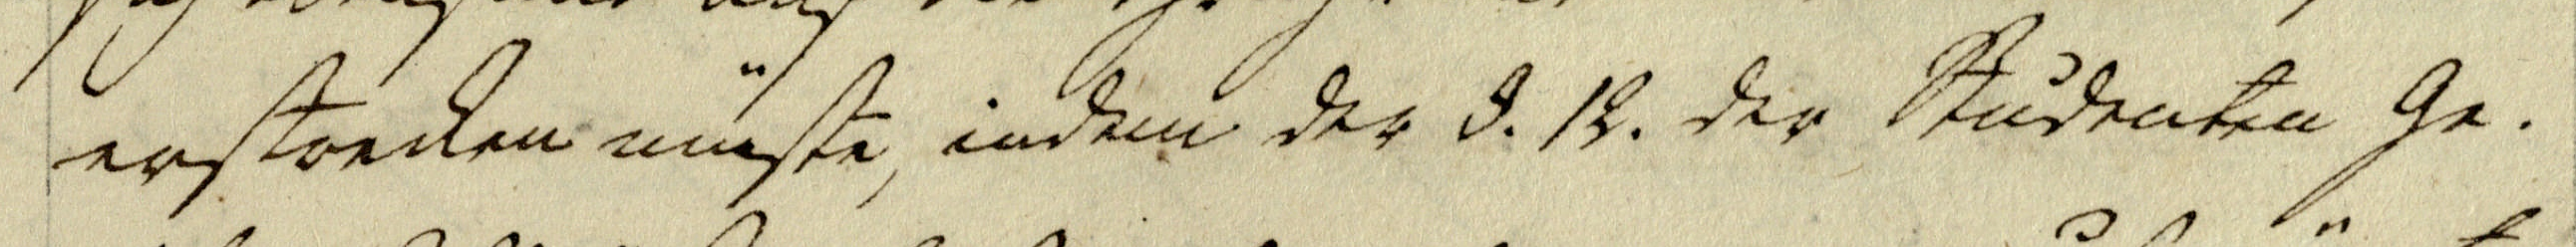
erstrecken müßte, indem der §. 12. der Studenten Ge¬
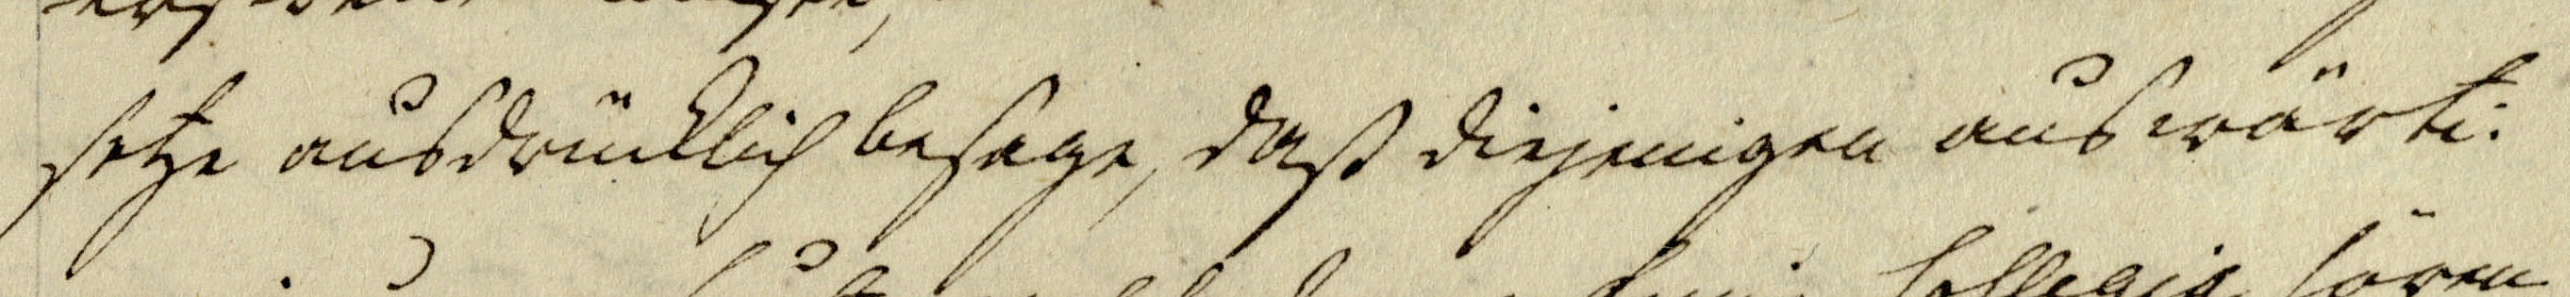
setze ausdrücklich besage, daß diejenigen auswärti¬
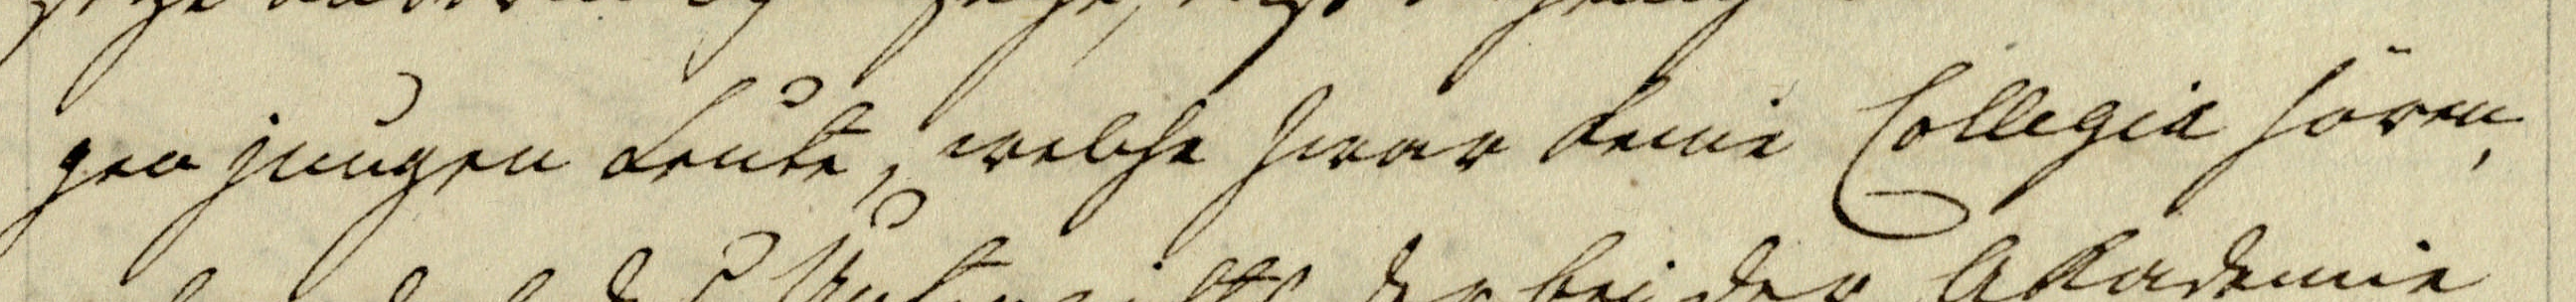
gen jungen Leute, welche zwar keine Collegio hören,
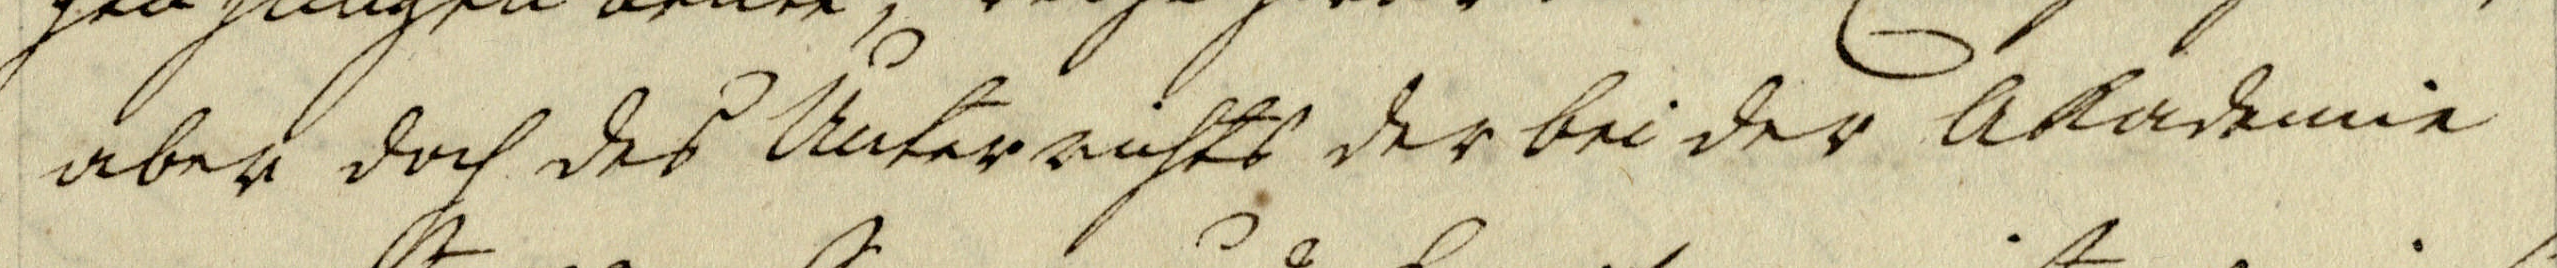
aber doch des Unterrichts der bei der Akademie
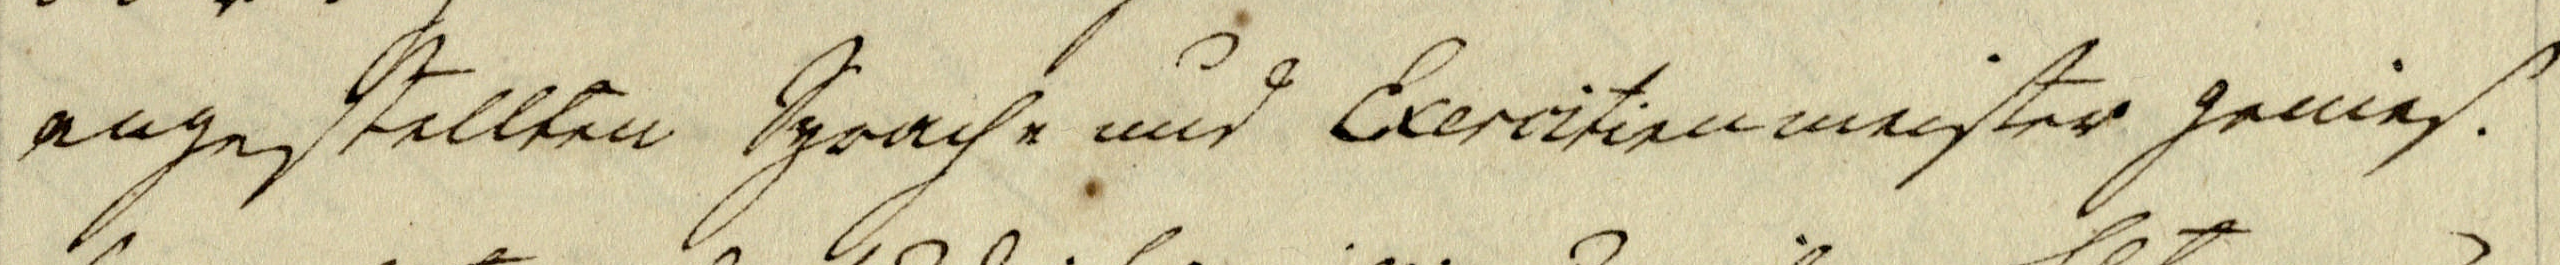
angestellten Sprach- und Exercitienmeister genies¬
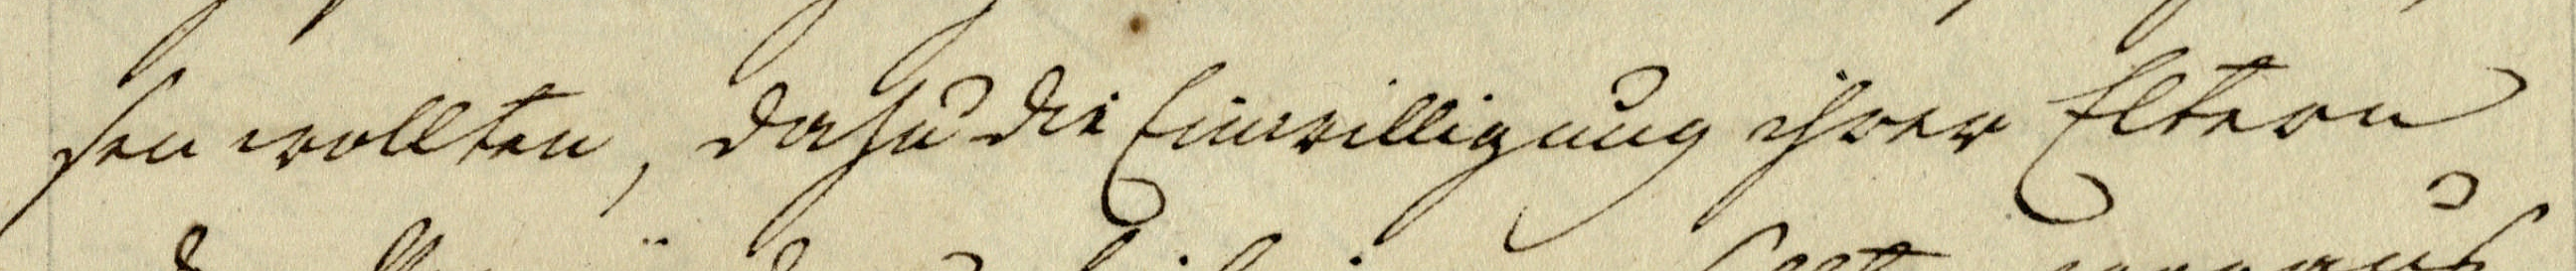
sen wollten, dazu die Einwilligung ihrer Eltern
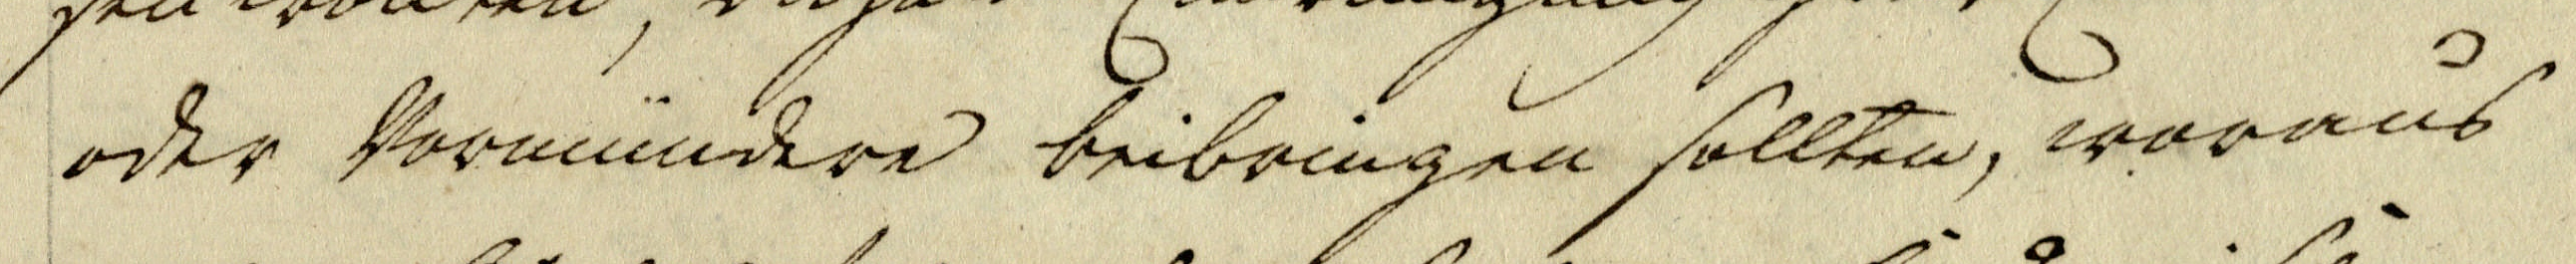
oder Vormündern beibringen sollten, woraus
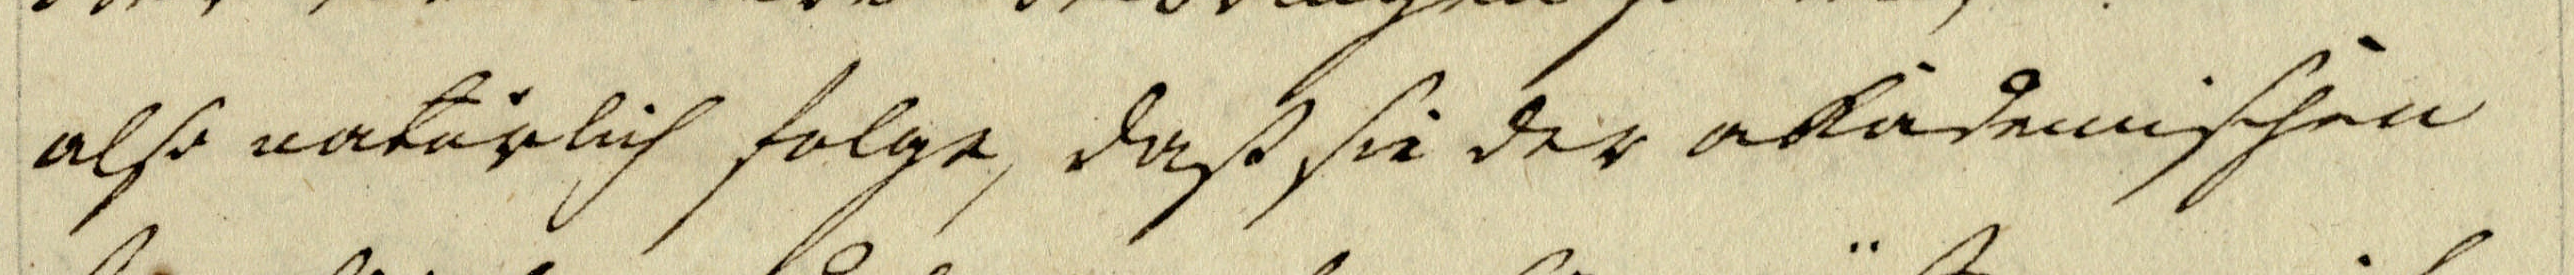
also natürlich folge, daß sie der akademischen
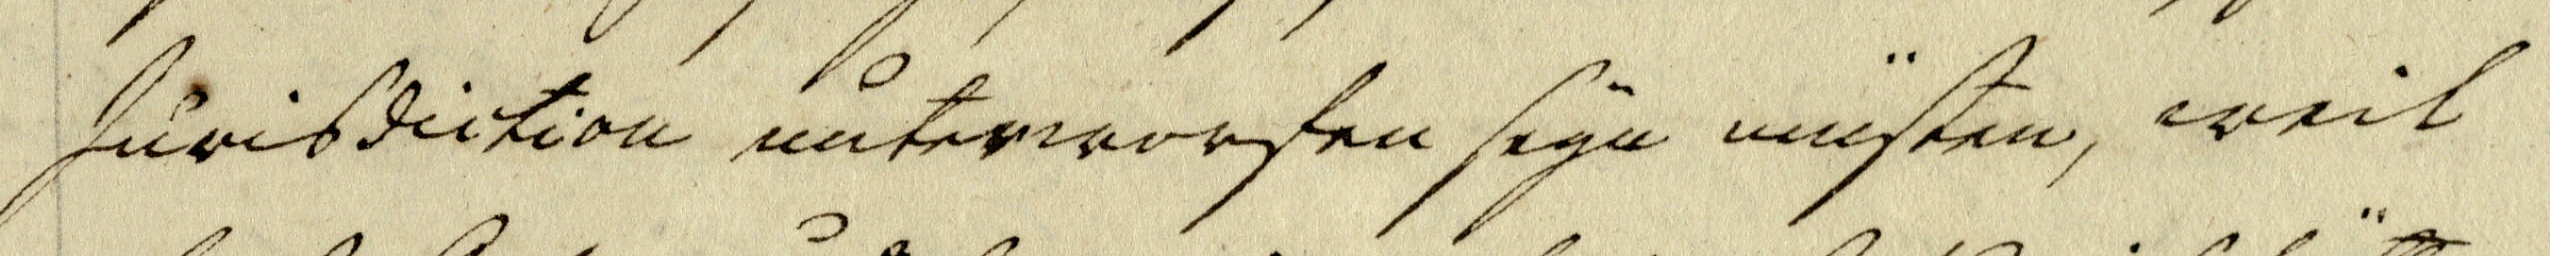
Jurisdiction unterworfen seÿn müßten, weil
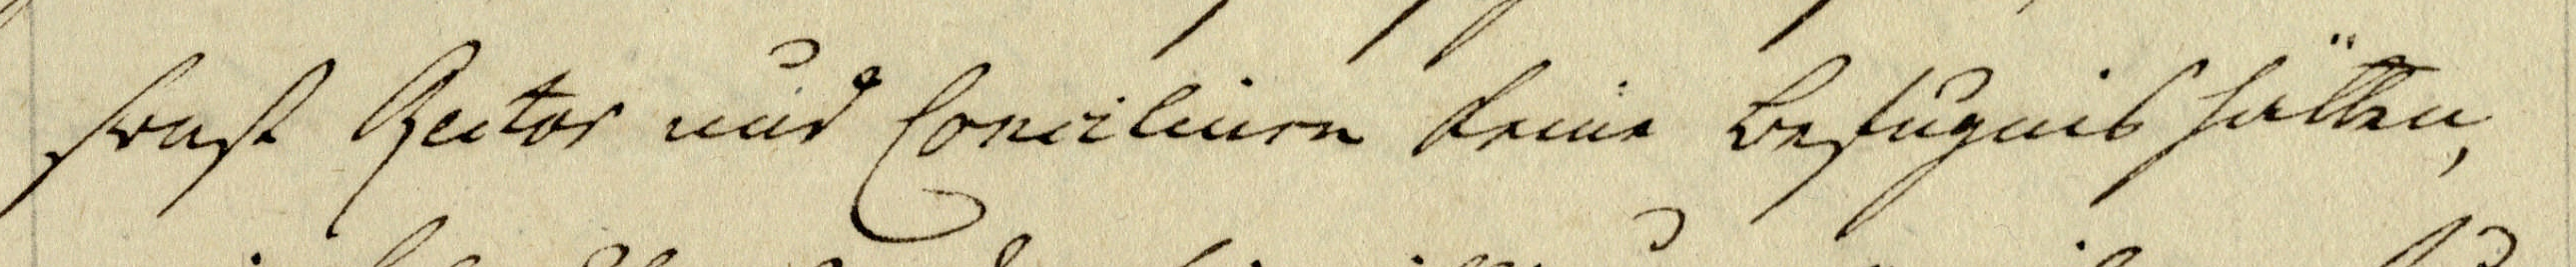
sonst Rector und Concilium keine Befugnis hätten,
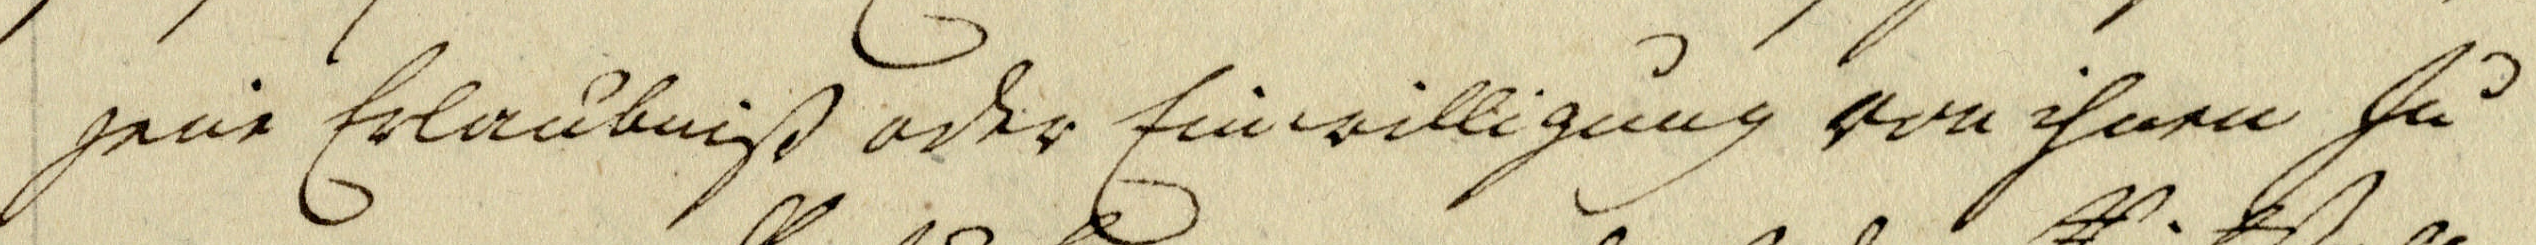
jene Erlaubnis oder Einwilligung von ihnen zu
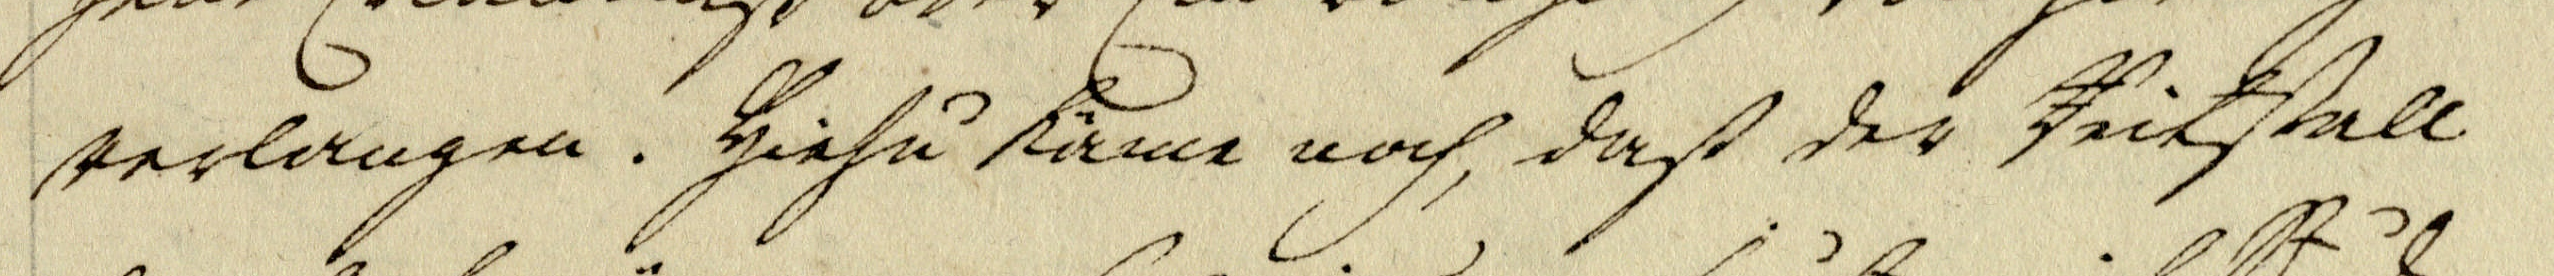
verlangen. Hiezu käme noch, daß der Reitstall
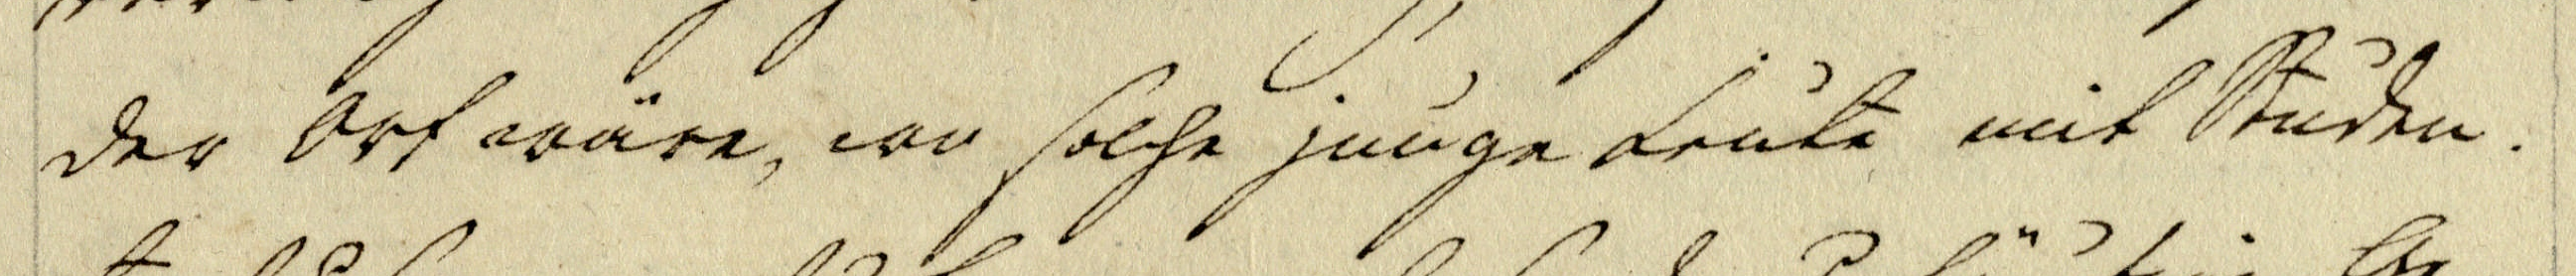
der Ort wäre, wo solche junge Leute mit Studen¬
